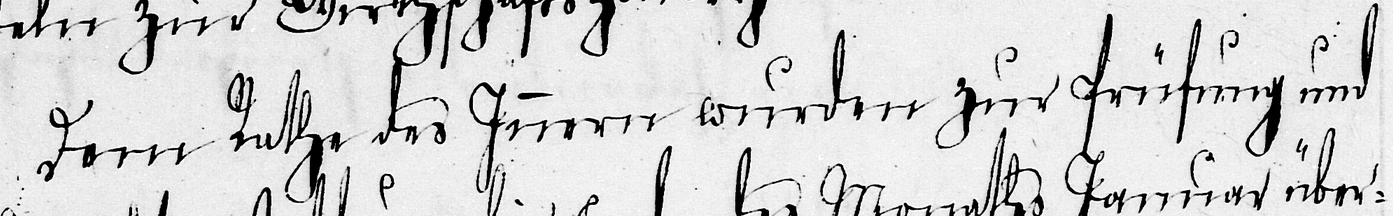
Dem Rathe des Innern wurden zur Prüfung und
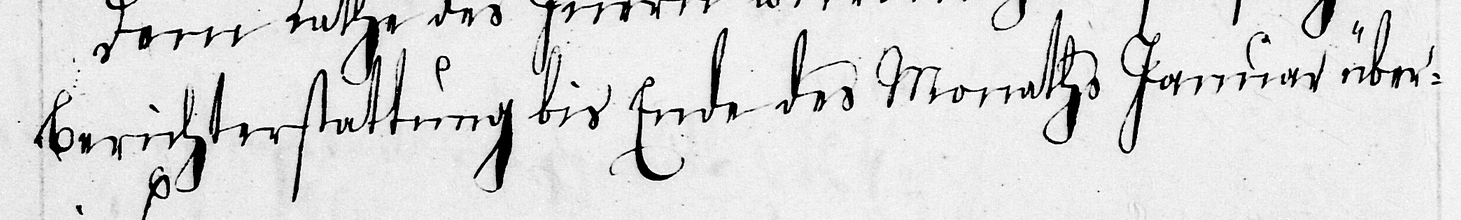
Berichtserstattung bis Ende des Monaths Januar über¬
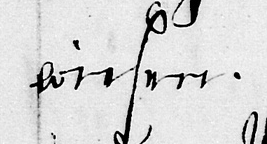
wiesen:
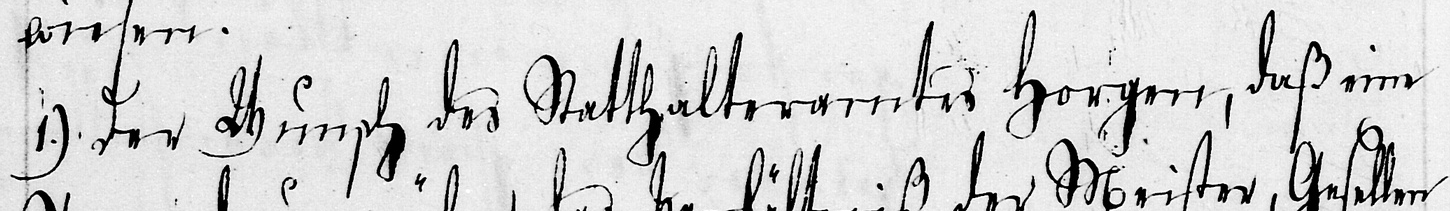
1.) Der Wunsch des Statthalteramtes Horgen, daß eine
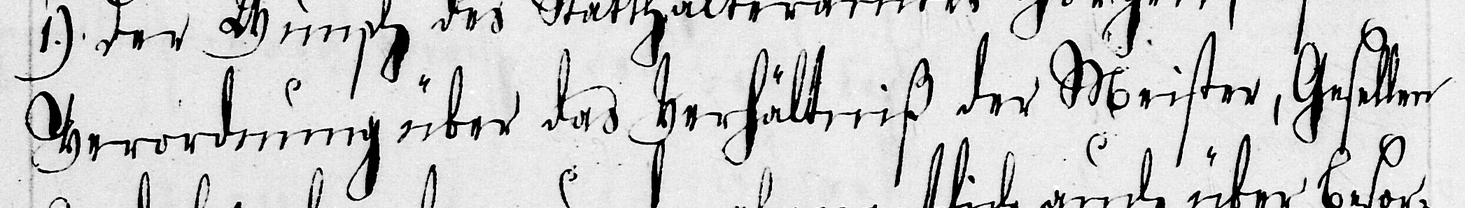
Verordnung über das Verhältniß der Meister, Gesellen
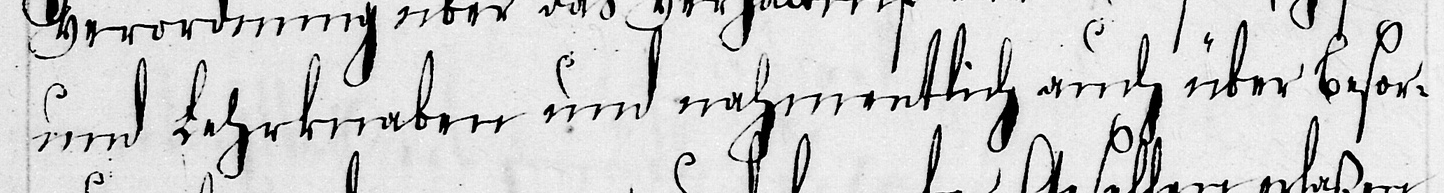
und Lehrknaben und nahmentlich auch über Besor¬
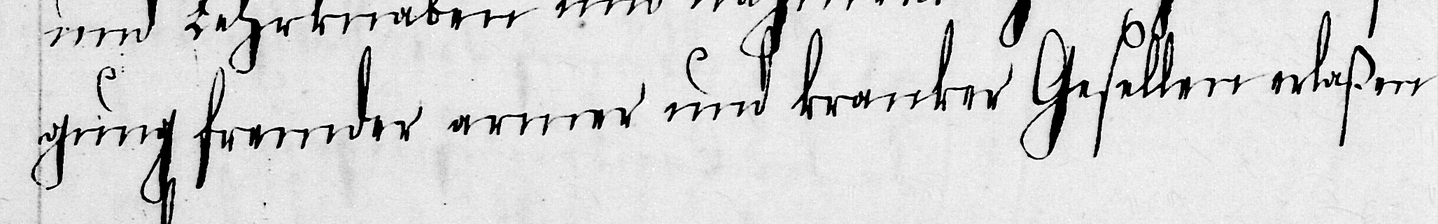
gung fremder armer und kranker Gesellen erlaßen
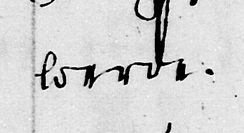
werde.
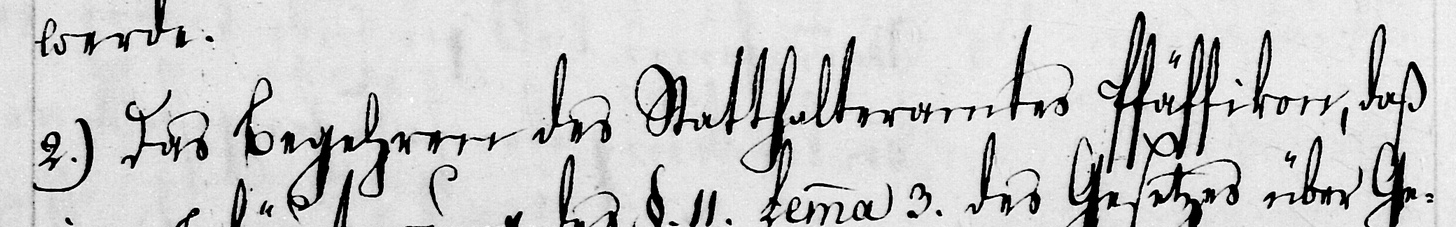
2.) Das Begehren des Statthalteramtes Pfäffikon, daß
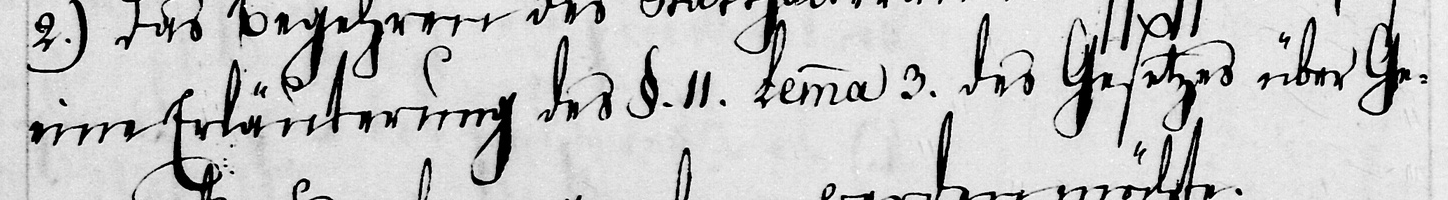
eine Erläuterung des §. 11. Lemma 3. des Gesetzes über Ge¬
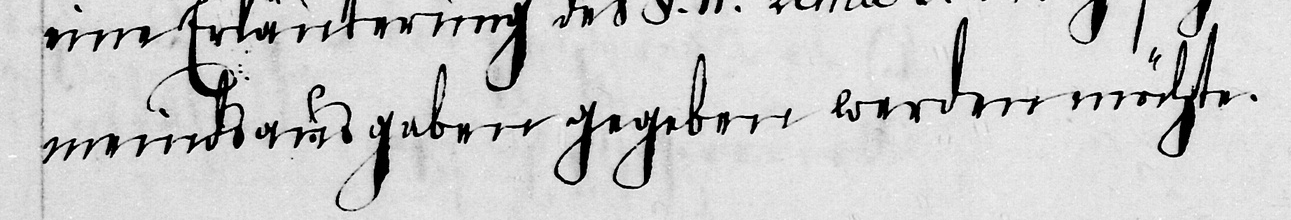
meindsausgaben gegeben werden möchte.
